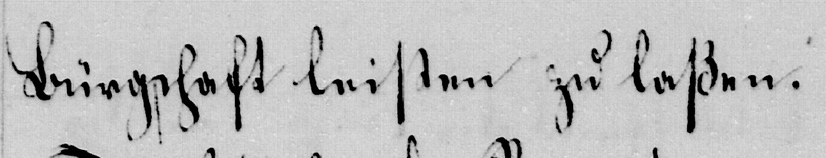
Bürgschaft leisten zu laßen.
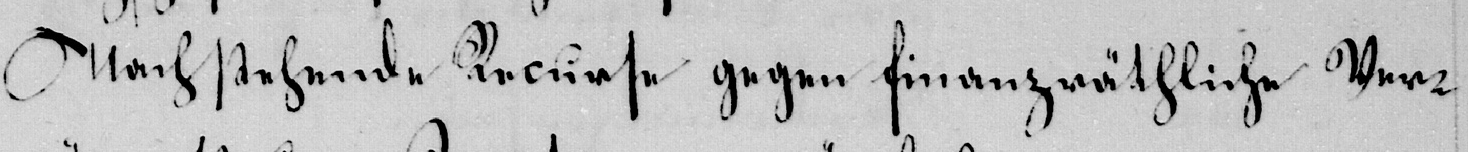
Nachstehende Recurse gegen finanzräthliche Ver¬
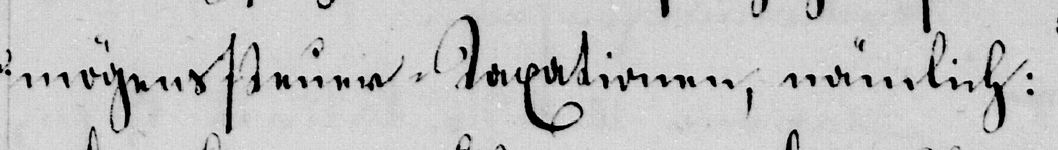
mögenssteuer-Taxationen, nämlich:
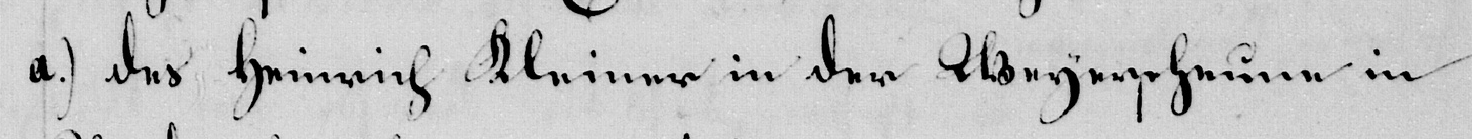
a.) des Heinrich Kleiner in der Weyerscheune in
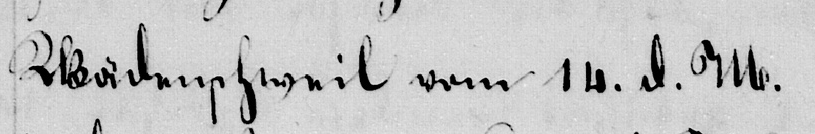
Wädenschweil vom 14. d. M.
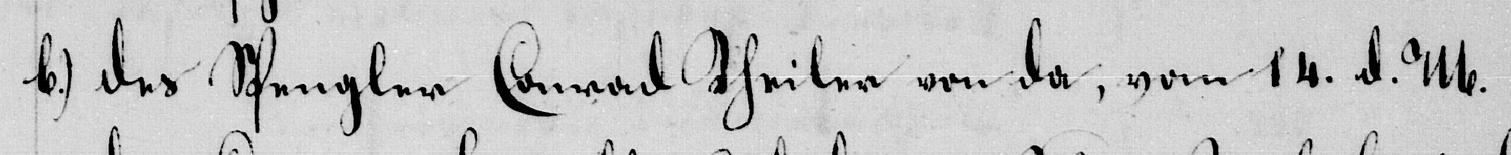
b.) des Spengler Conrad Theiler von da, vom 14. d. M.
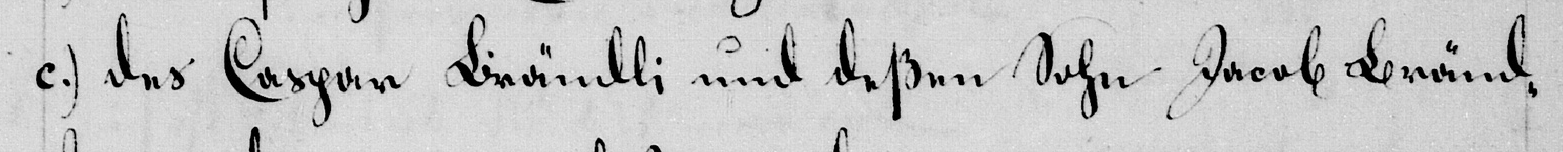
c.) des Caspar Brändli und deßen Sohn Jacob Bränd¬
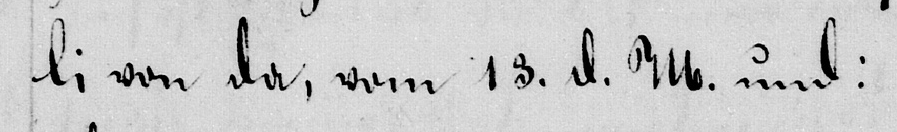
li von da, vom 13. d. M. und:
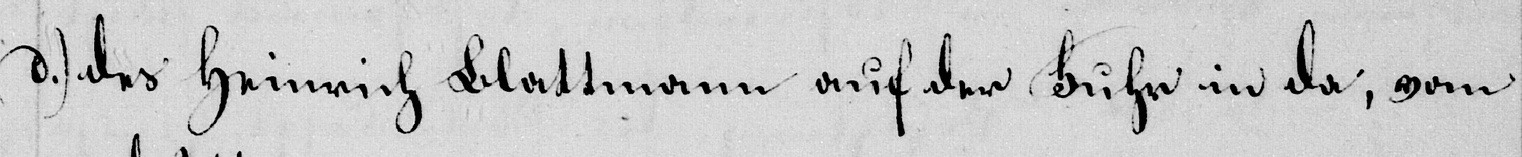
d.) des Heinrich Blattmann auf der Fuhr in da, vom
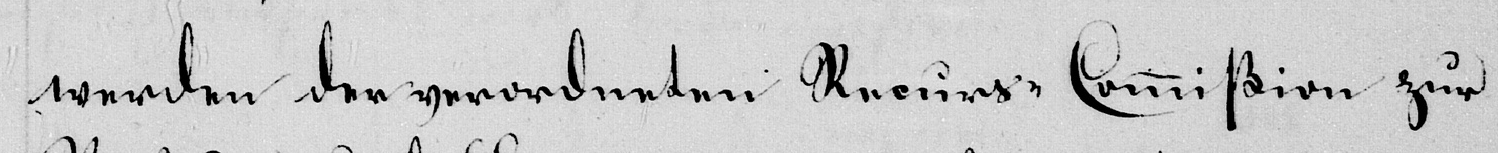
werden der verordneten Recurs-Commißion zur
